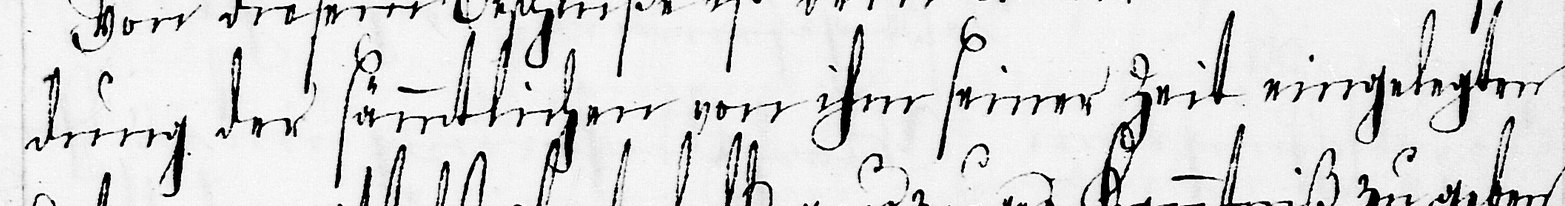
dung der sämmtlichen von ihm seiner Zeit eingelegten
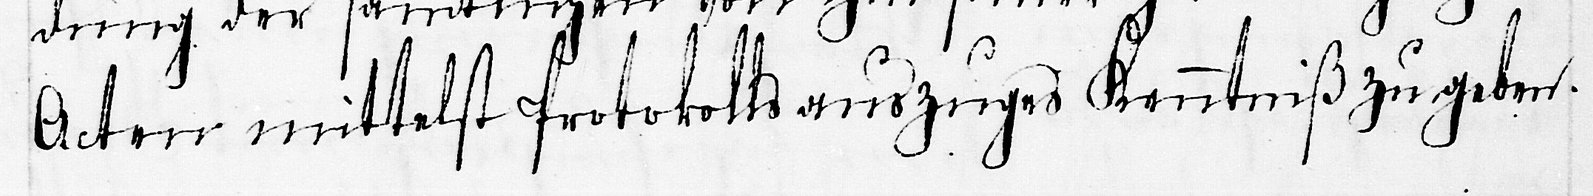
Acten mittelst Protokollsauszuges Kenntniß zu geben.
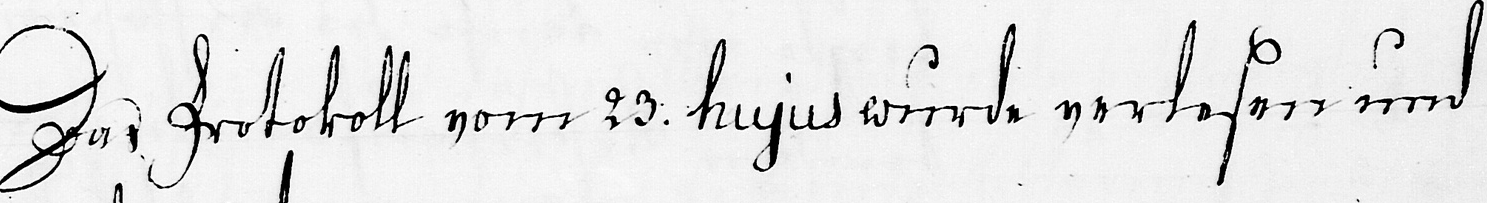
Das Protokoll vom 23. hujus wurde verlesen und
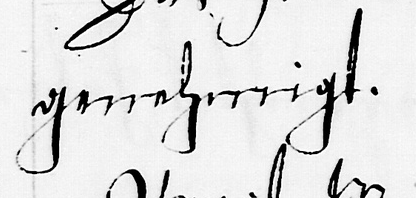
genehmigt.
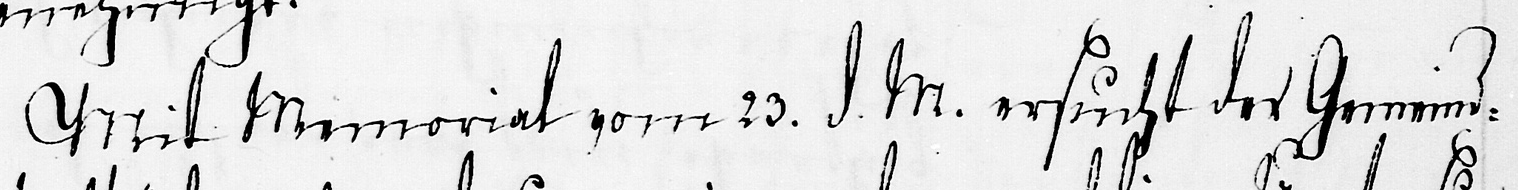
Mit Memorial vom 23. d. M. ersucht der Gemeind¬
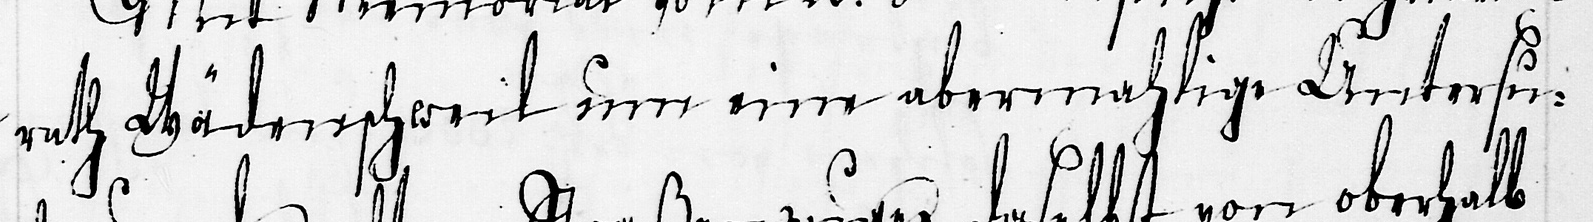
rath Wädenschweil um eine abermahlige Untersu¬
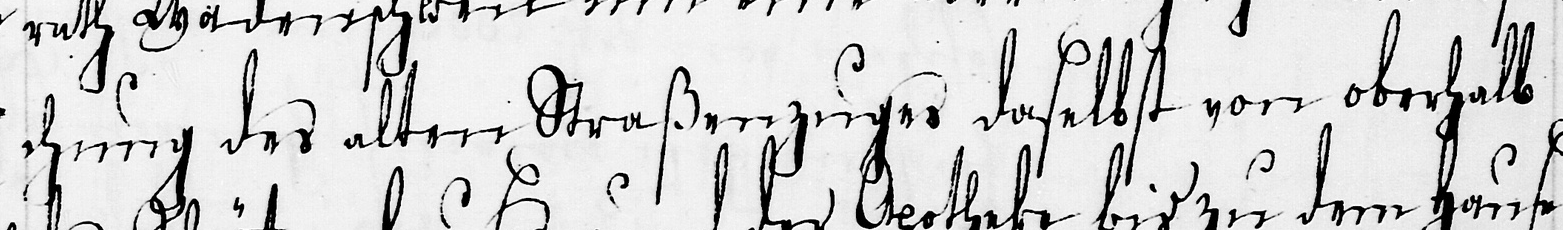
chung des alten Straßenzuges daselbst von oberhalb
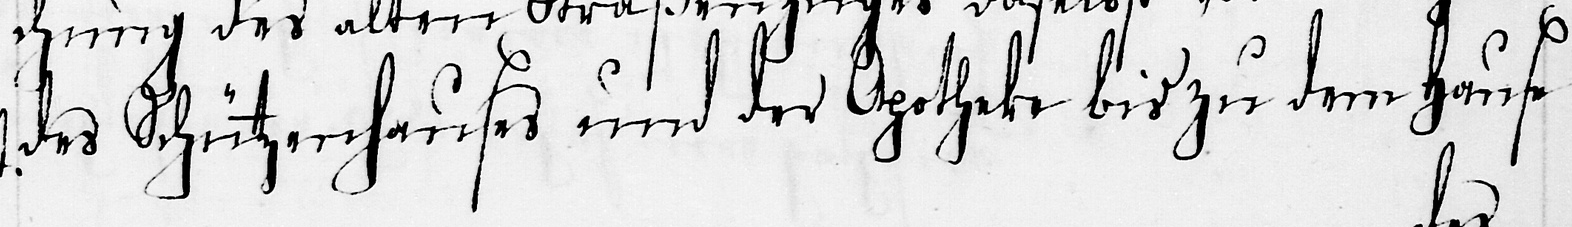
des Schützenhauses und der Apotheke bis zu dem Hause
